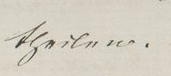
theilen. –
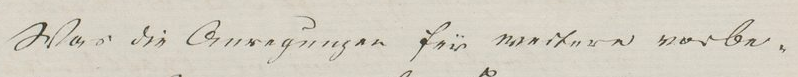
Was die Anregungen für weitere vorbe-
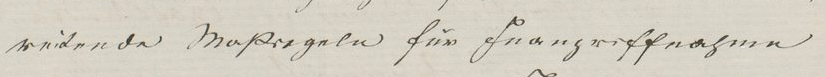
reitende Maßregeln für Inangriffnahme
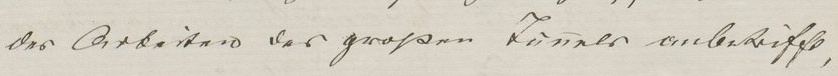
der Arbeiten des großen Tunnels anbetrifft,
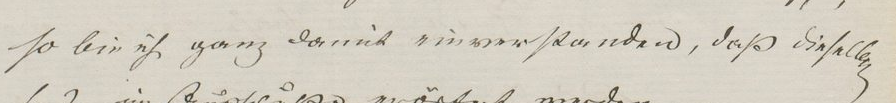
so bin ich ganz damit einverstanden, daß dieselben
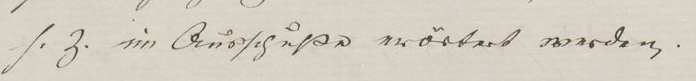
s. Z. im Ausschuße erörtert werden. –
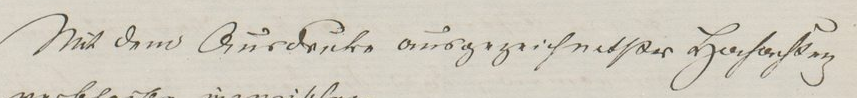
Mit dem Ausdruke ausgezeichnetster Hochachtung
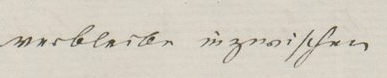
verbleibe inzwischen
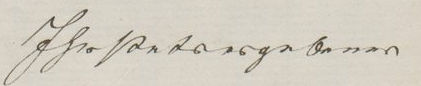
Ihr stets ergebener
